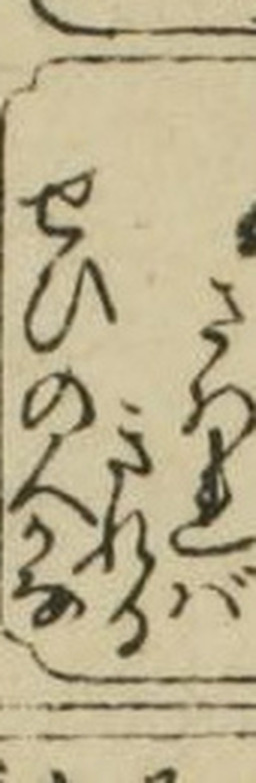せひの人かな
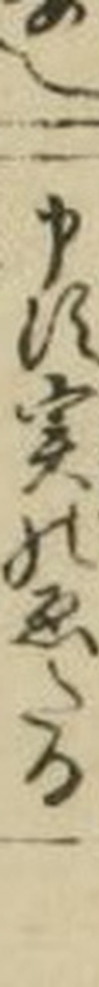申す実のゑたる
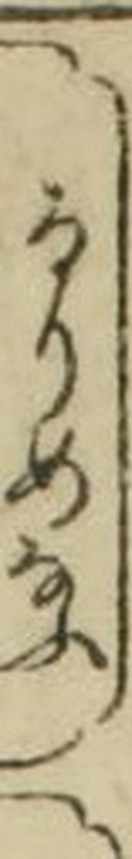るりめなふ
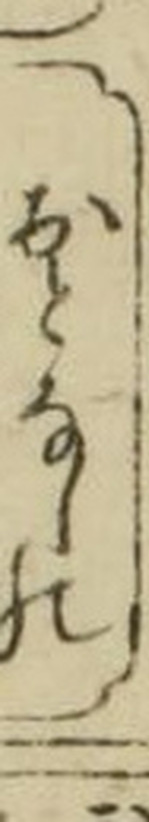おとなしの
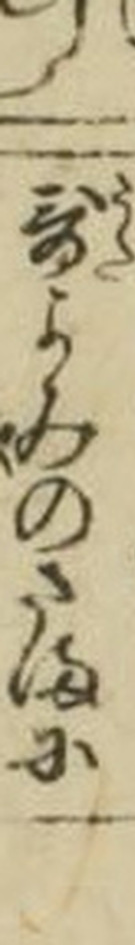哥よみのさまに
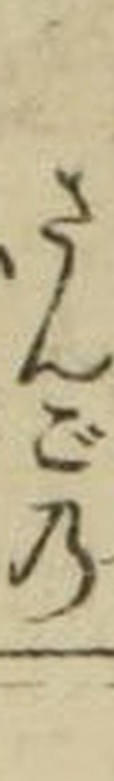さんごの
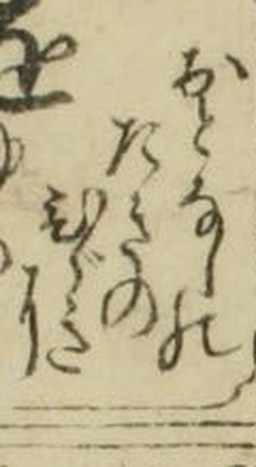さきの
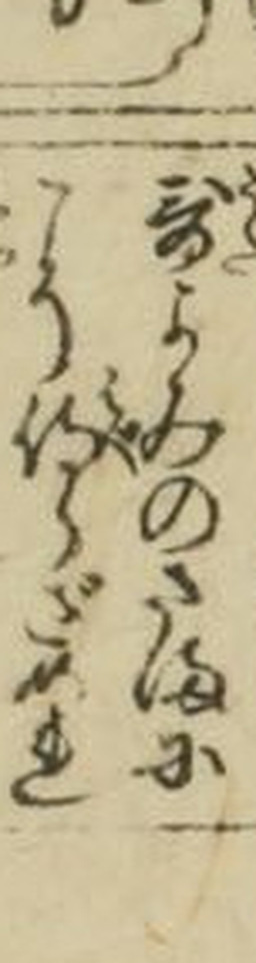こそ侍らざめれ
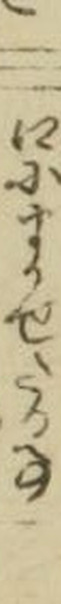口にまかせたる事
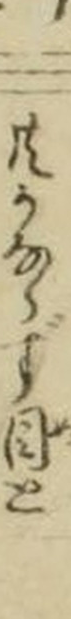共かならず目と
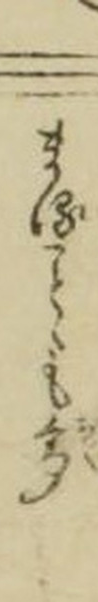まることヽも多
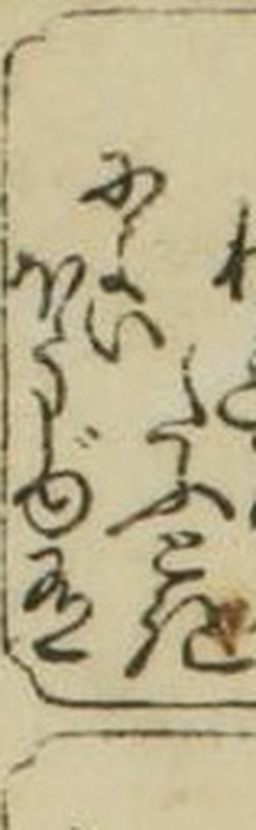ほうじゆ有
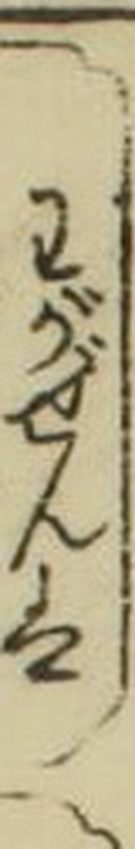わがぜんは
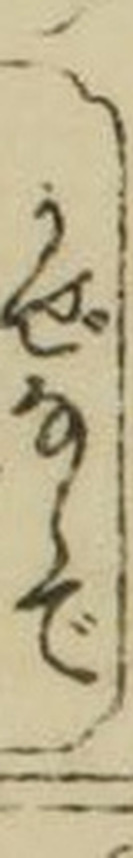かぜならで
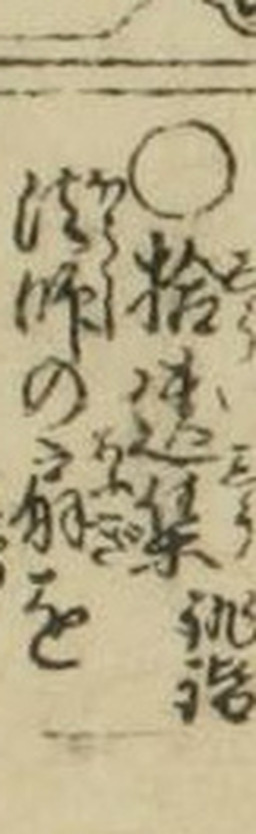法師の扇を
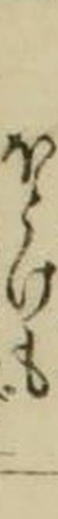ほとけも
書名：女源氏教訓鑑
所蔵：東京学芸大学附属図書館
